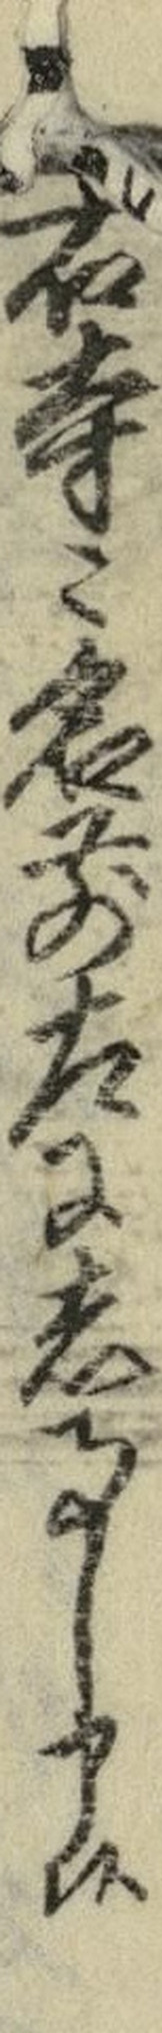右寺〻名前左に志るし申候
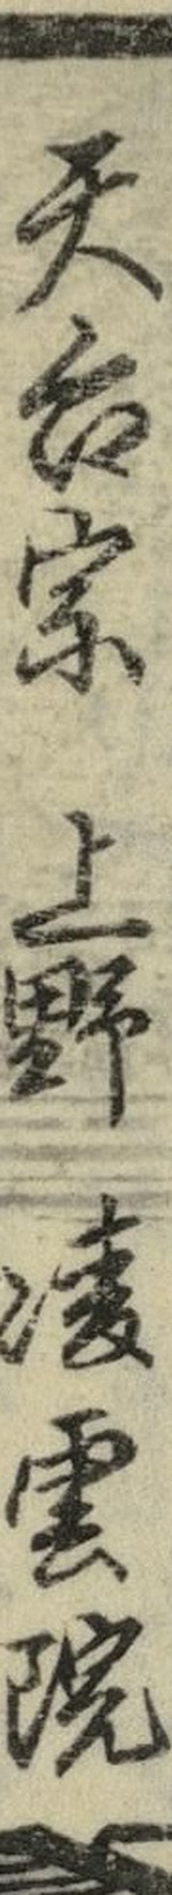天台宗上野凌雲院
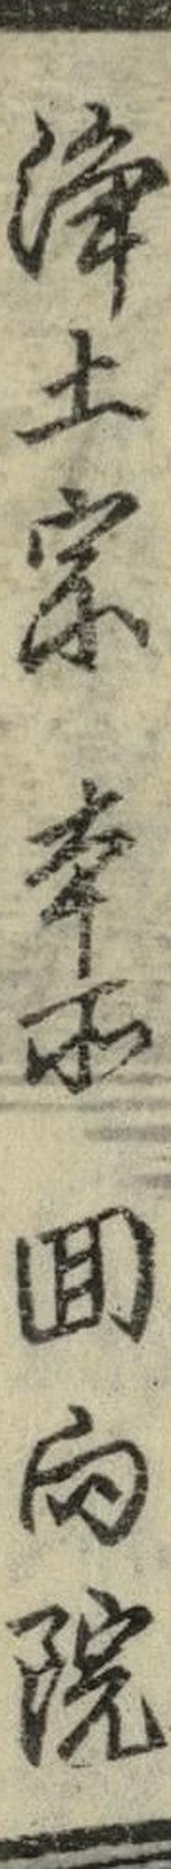浄土宗本所回向院
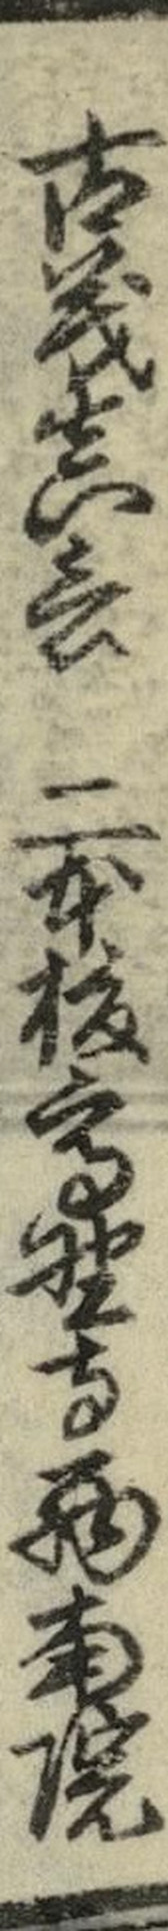古義真言二本橋高野寺西南院
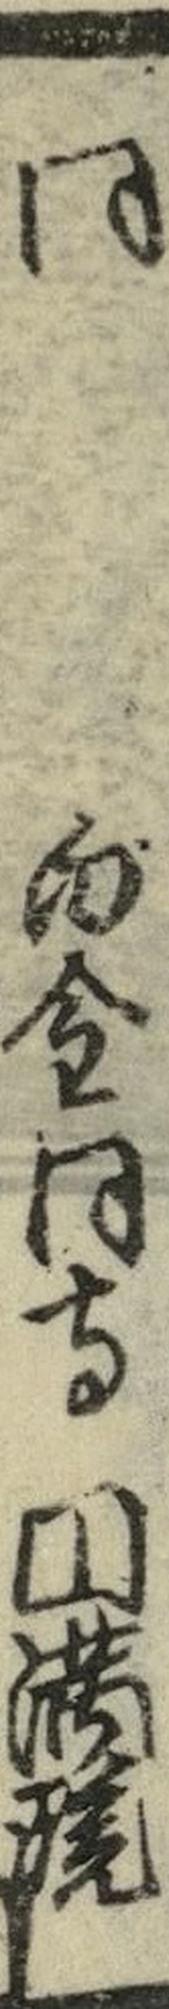同白金同寺円満院
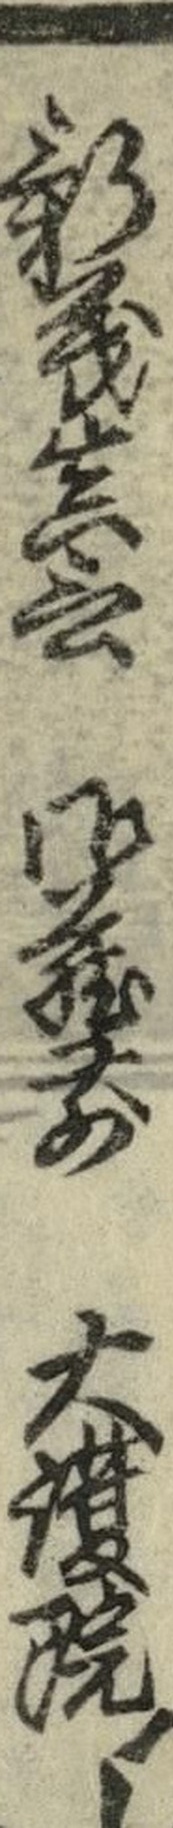新義真言御蔵前大護院
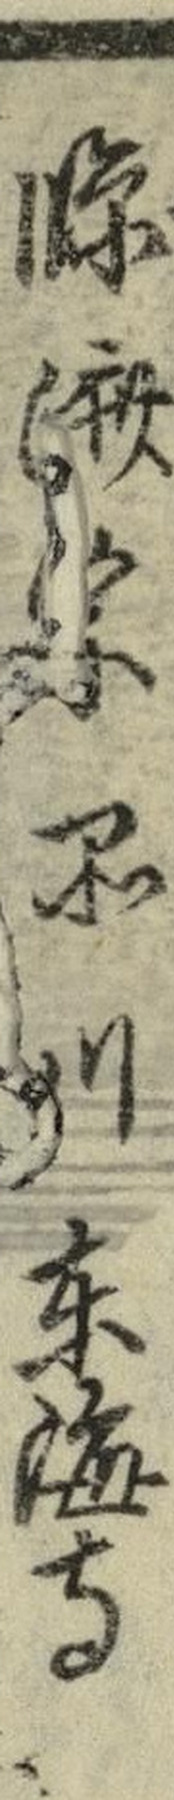臨済宗品川東海寺
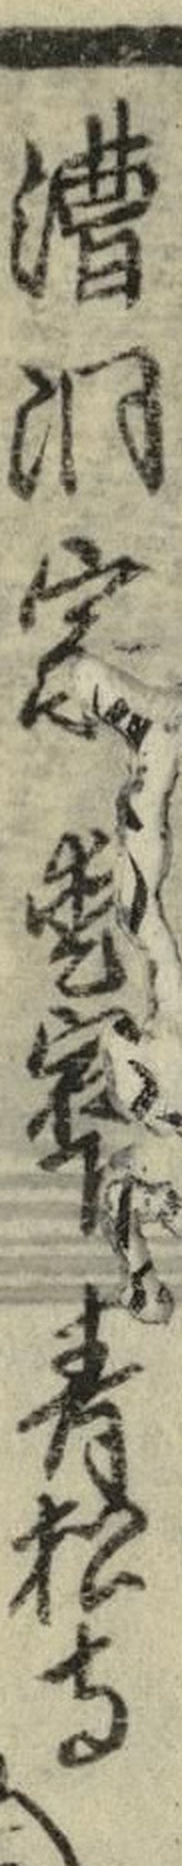漕洞宗愛宕下青松寺
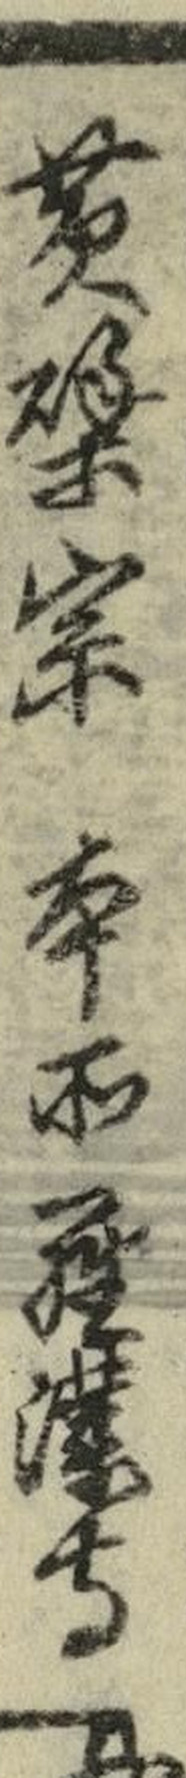黄檗宗本所羅漢寺
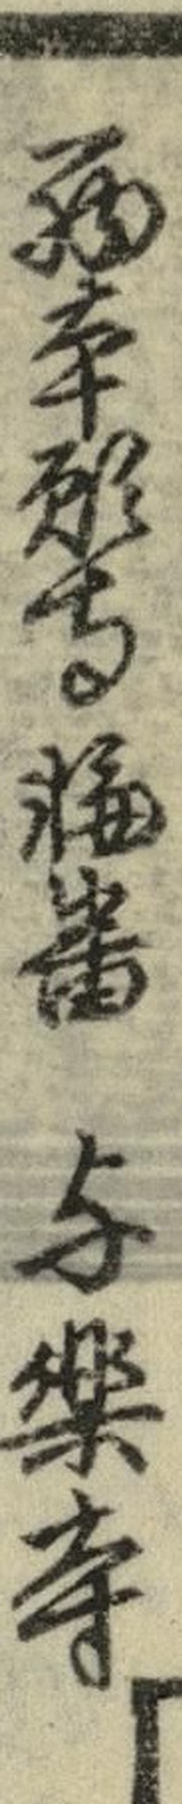西本願寺輪番与楽寺
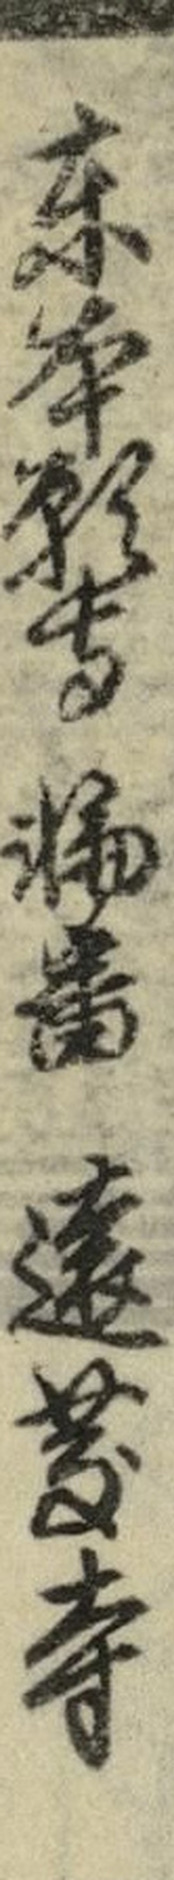西本願寺輪番与楽寺
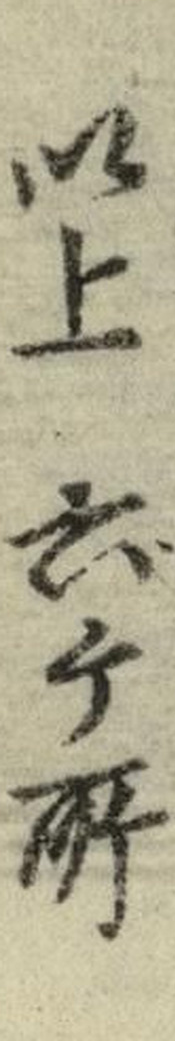以上六ケ所
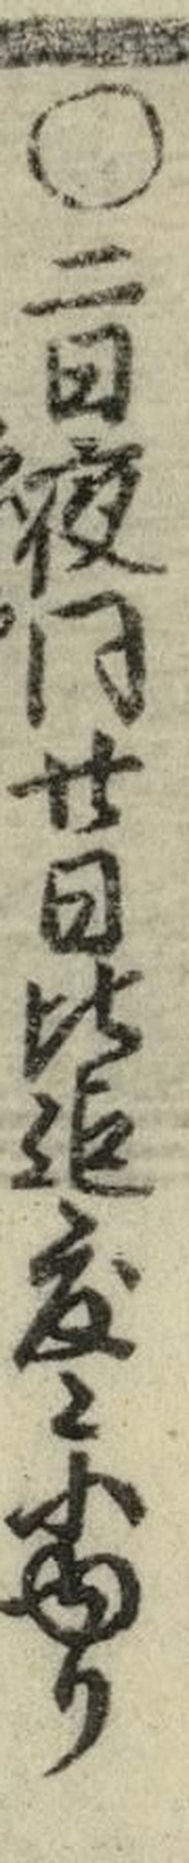〇二日夜同廿日比迄度ゝ小ゆり
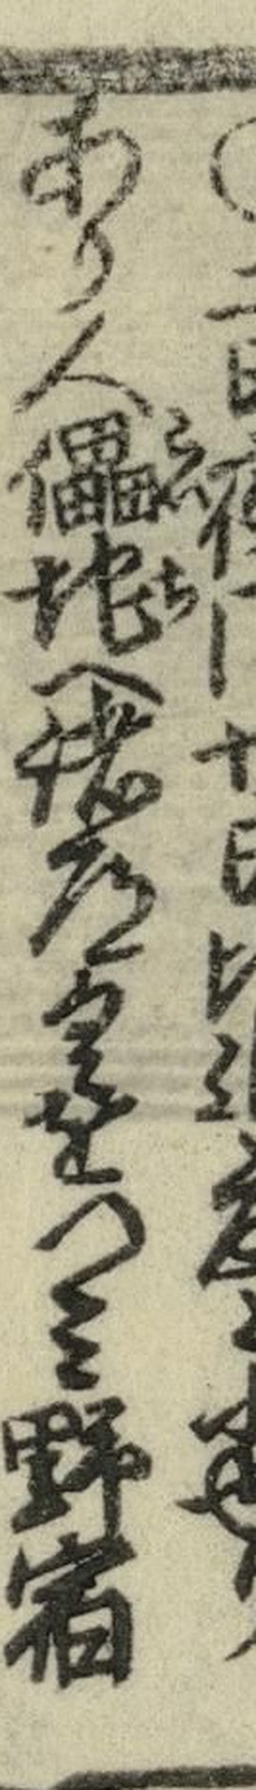あり人儡地へ諸道具をつみ野宿
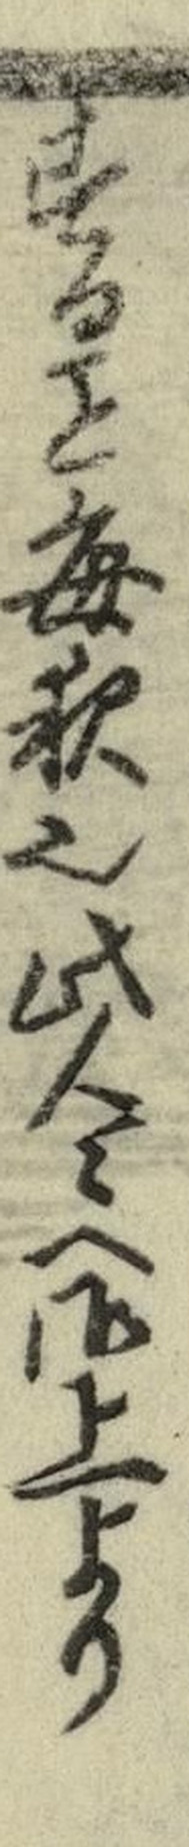すること毎夜也此人〻へ御上より
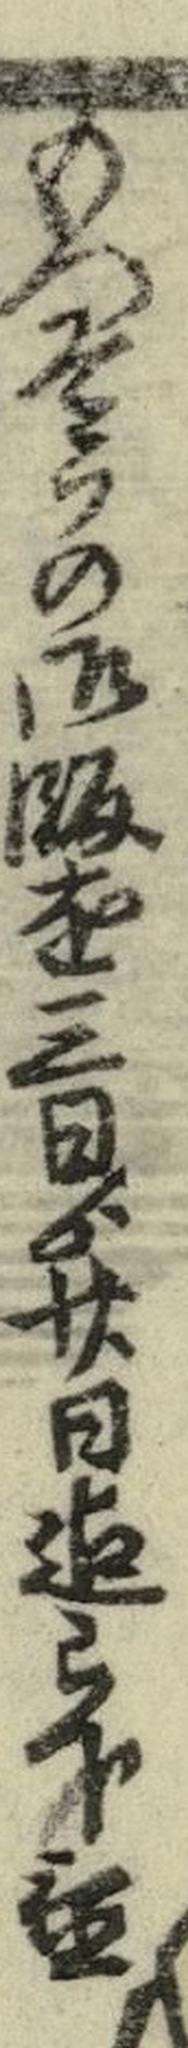の大そうの御飯を三日ゟ廿日迄被下置
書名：地震年代記
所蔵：東京大学地震研究所図書室 Earthquake Research Institute Library, The University of Tokyo, JAPAN
